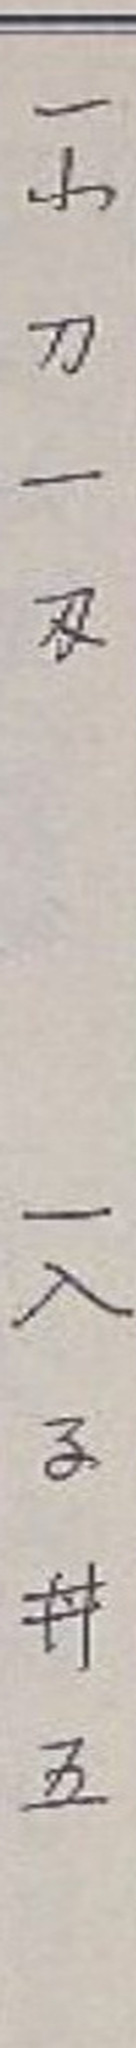一小刀一刃一入子丼五
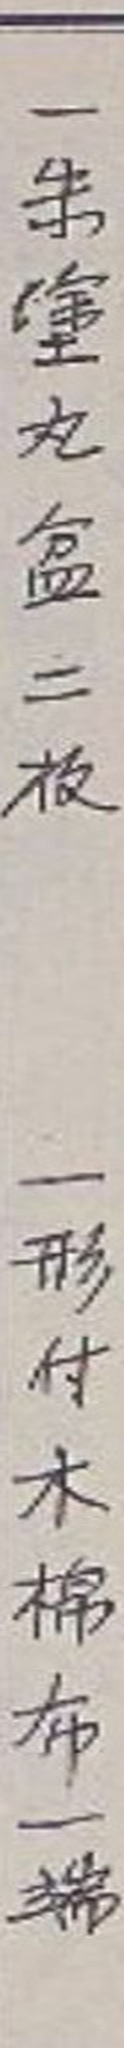一朱塗丸盆二枚一形付木棉布一端
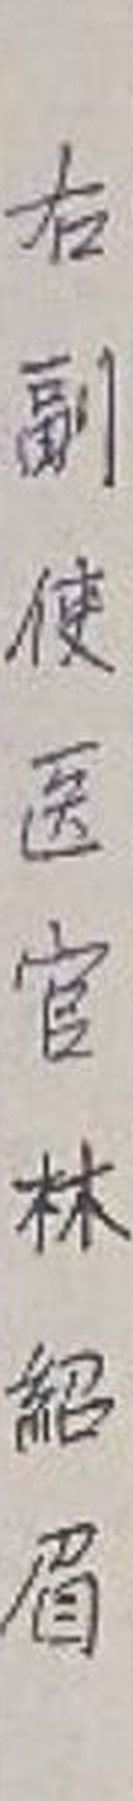右副使医官林紹眉
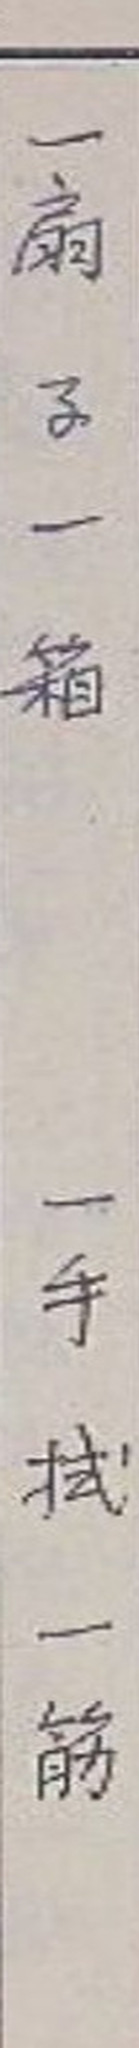一扇子一箱一手拭一筋
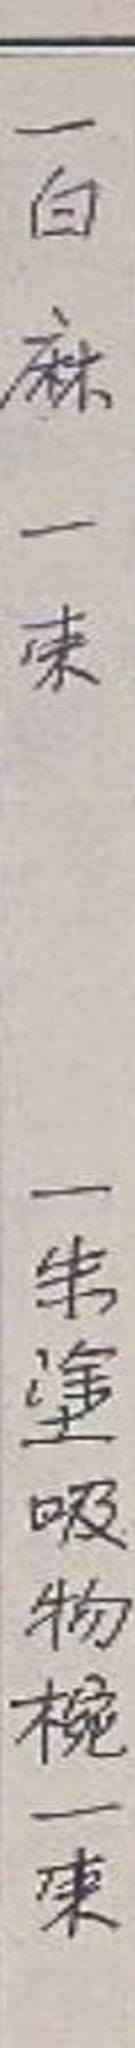一白麻一束一朱塗吸物椀一束
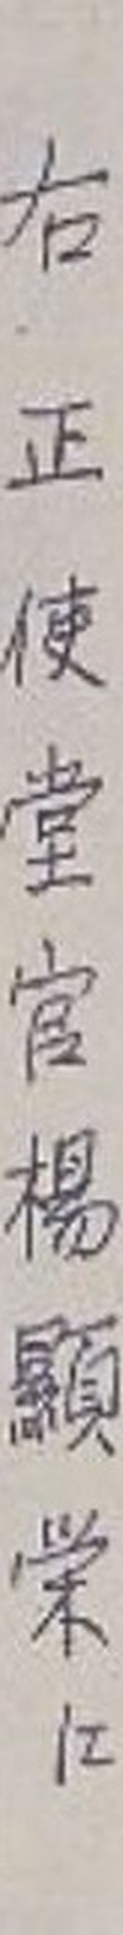右正使堂官楊顕栄え
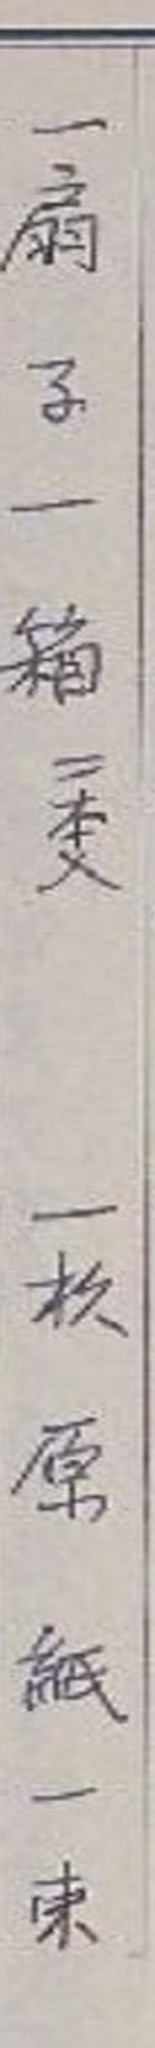一扇子一箱二本入一杉原紙一束
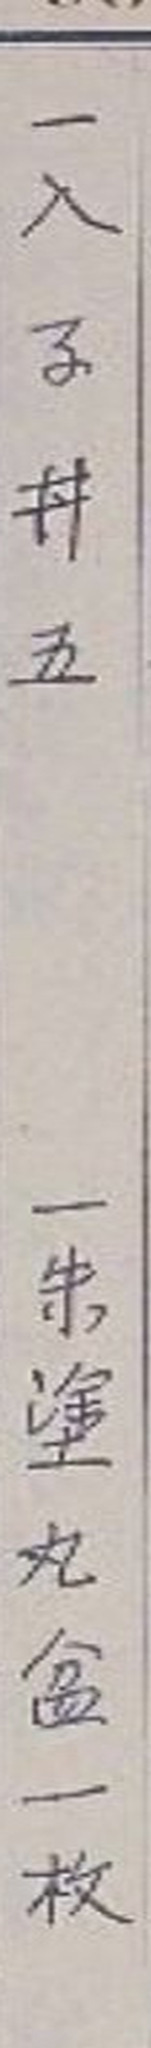一入子丼五一朱塗丸盆一枚
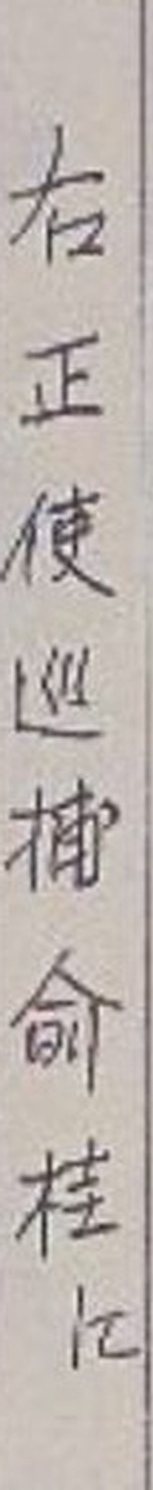右正使巡捕兪桂え
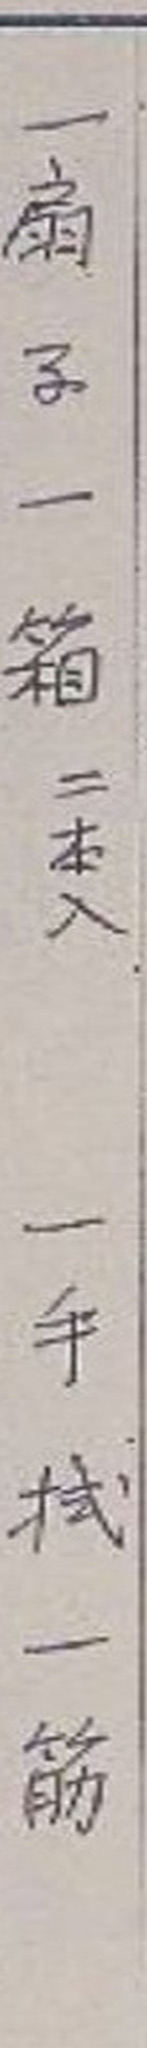一扇子一箱二本入一手掛一筋
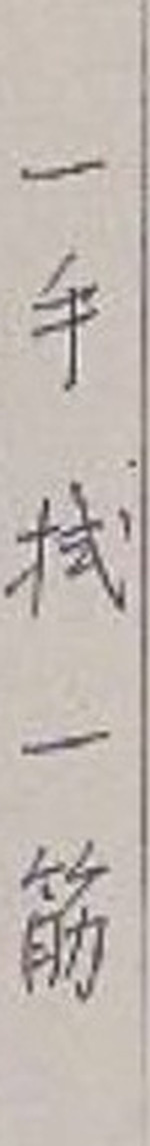一扇子一箱一手拭一筋
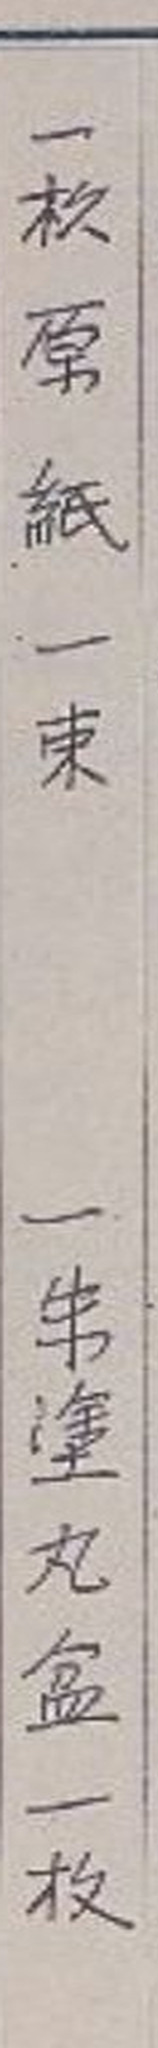一杉原紙一束一朱塗丸盆一枚

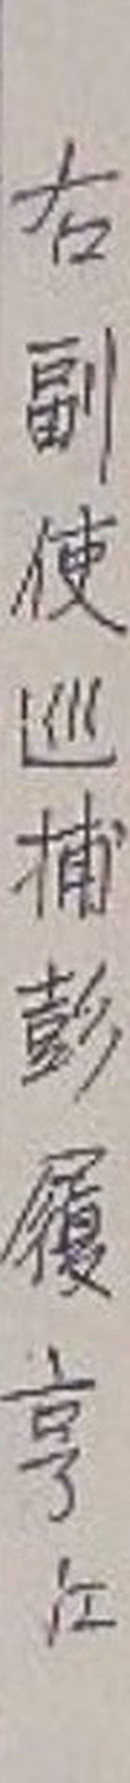右副使巡捕彭履亨え
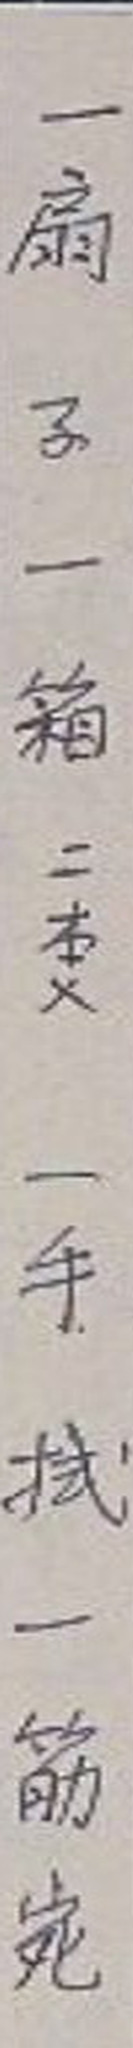一扇子一箱二本入一手拭一筋宛
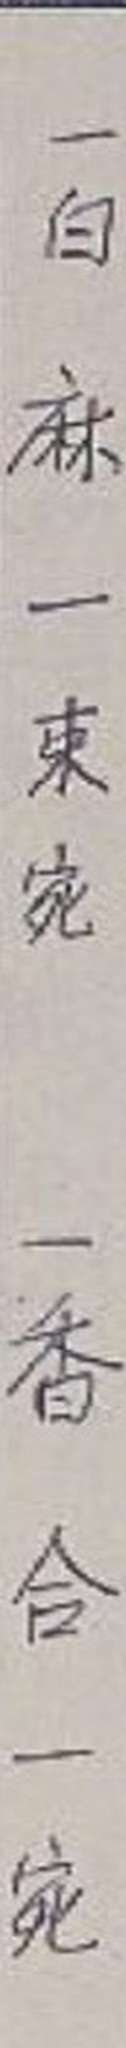一白麻一束宛一香合一宛
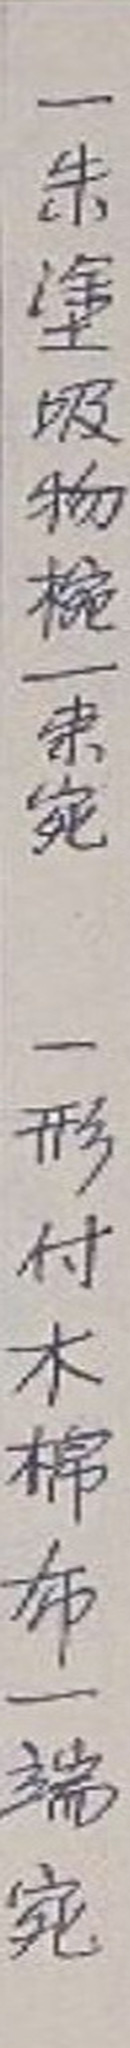一朱塗吸物椀一束宛一形付木棉布一端宛
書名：支那冊封使来琉諸記 下巻
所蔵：University of the Ryukyus Library
